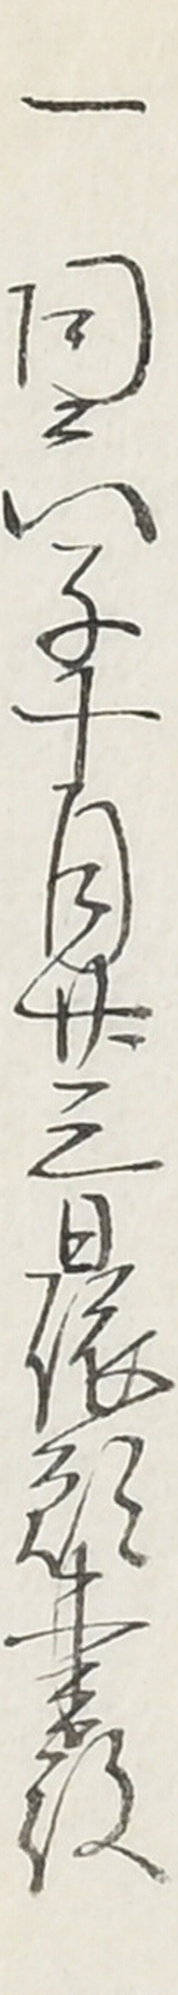一同六子十月廿三日依願書役
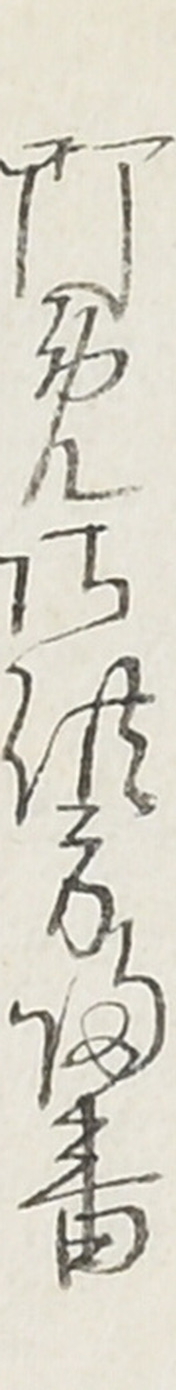御免御供方帰番
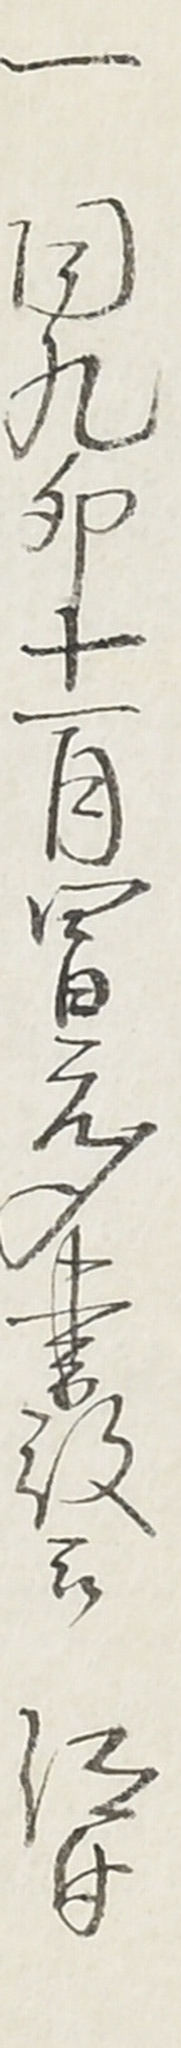一同九卯十一月四日元〆書役被仰付
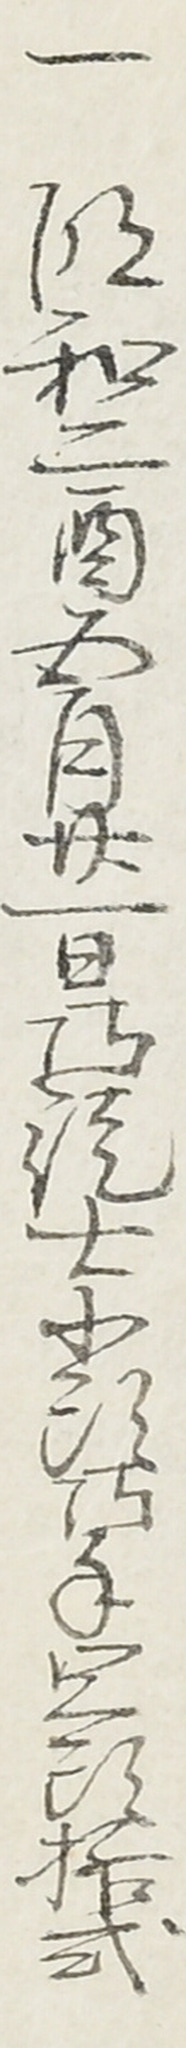一明和二酉五月廿一日御徒士小頭御手廻頭格式
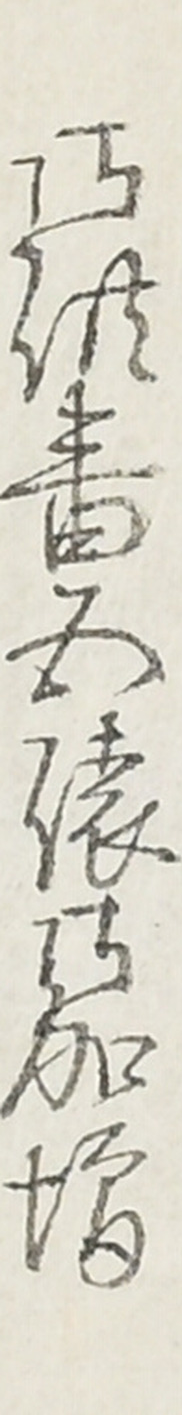御供番五俵御加増
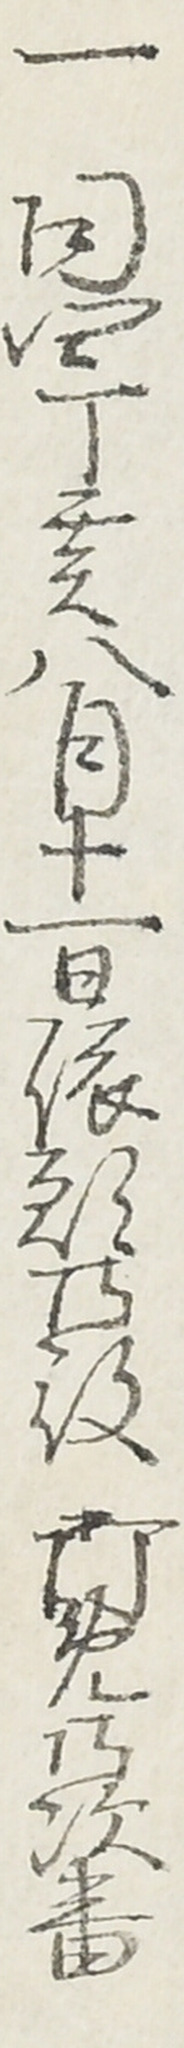一同四丁亥八月十一日依願御役御免御次番
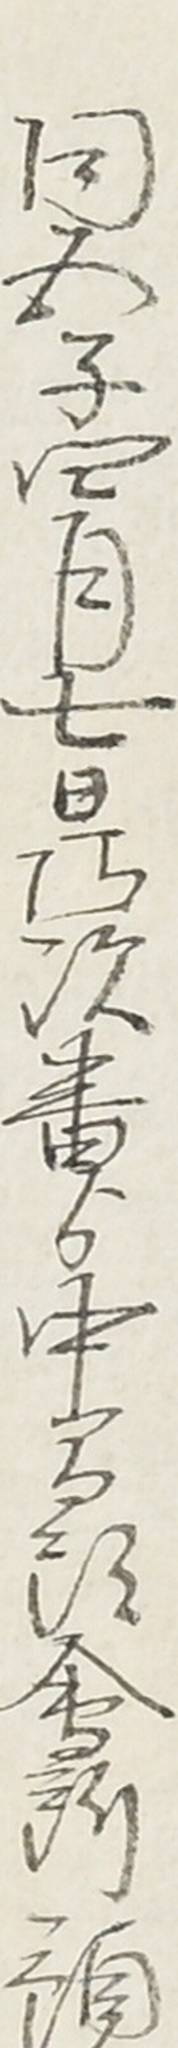一同五子四月七日御次番ゟ中間頭会所預り
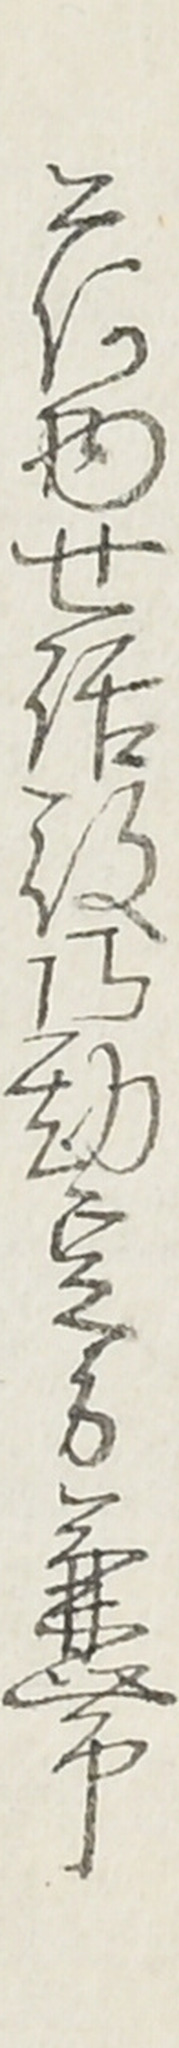荷物世話役御勘定方兼帯
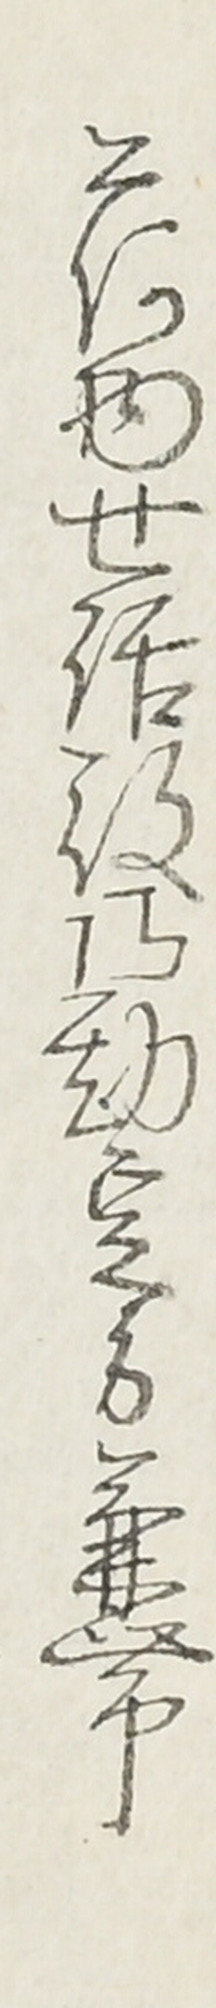荷物世話役御勘定方兼帯
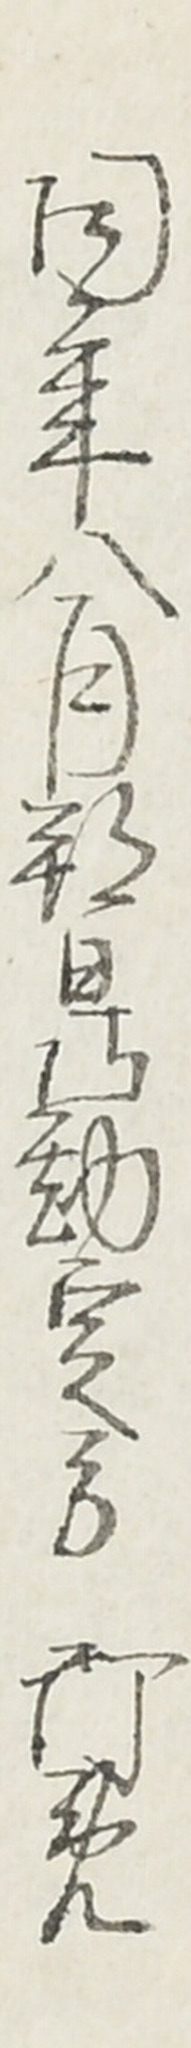一同年八月朔日御勘定方御免
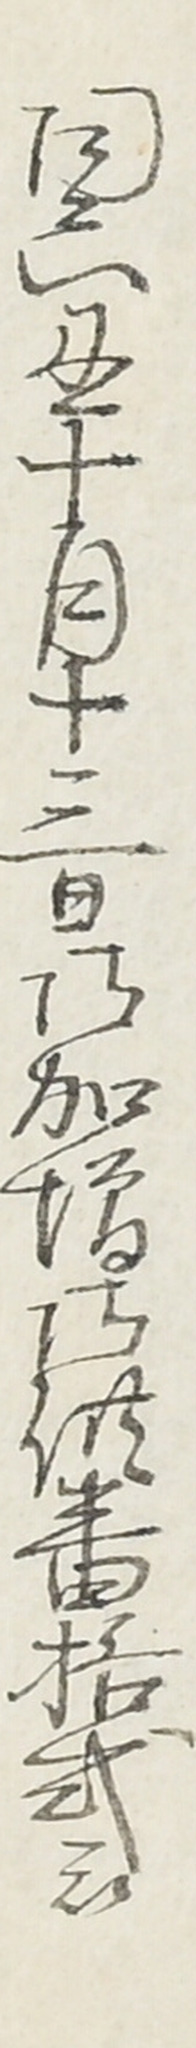一同六丑十月十三日御加増御供番格式被
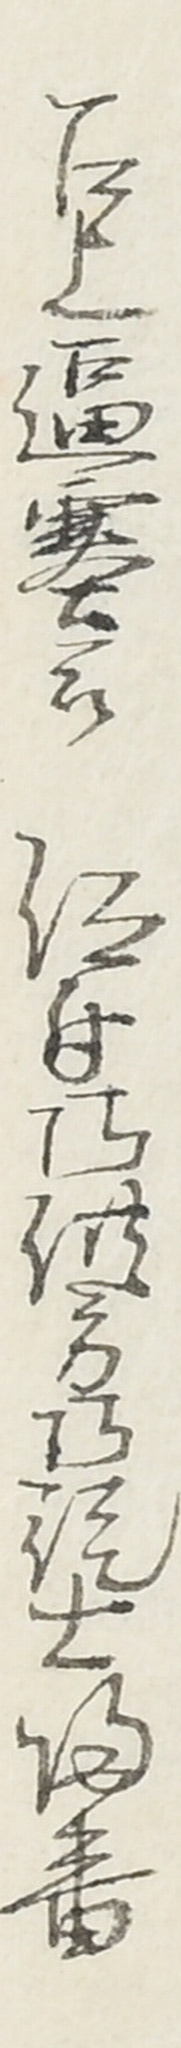召上逼塞被仰付御供方御徒士帰番

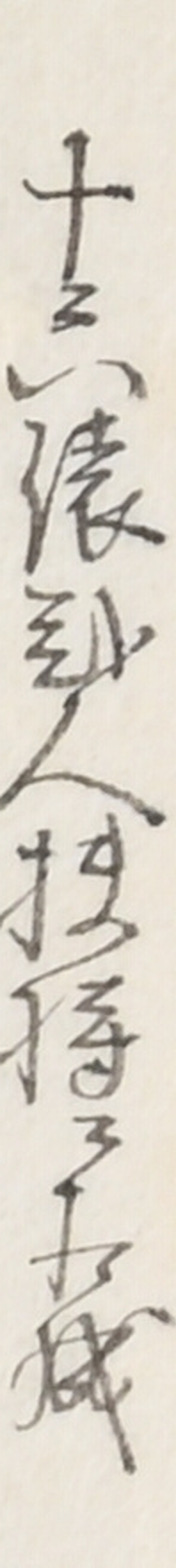十六俵弐人扶持ニ相成
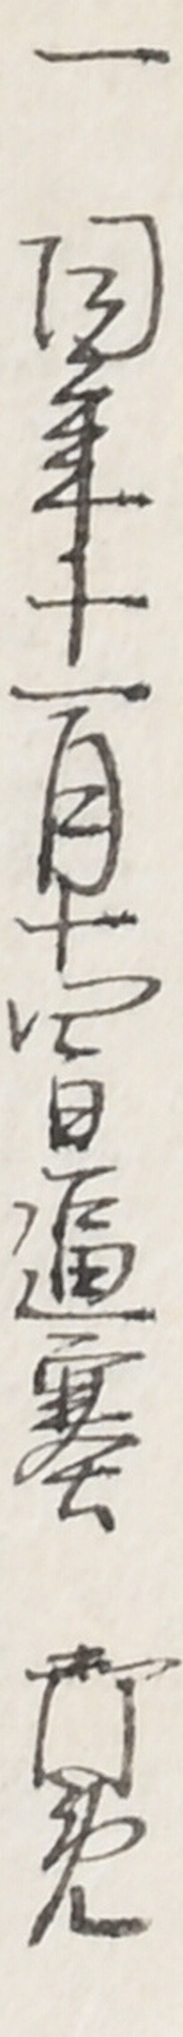一同年十一月十四日逼塞御免
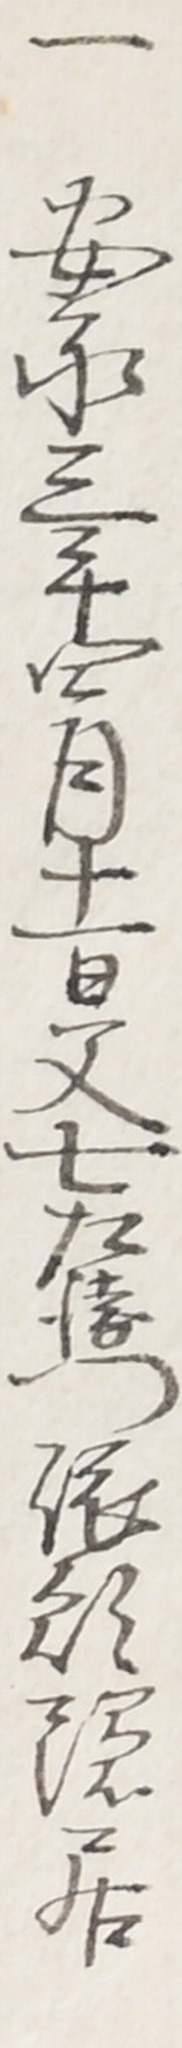一安永三午四月十一日父七左衛門依願隠居
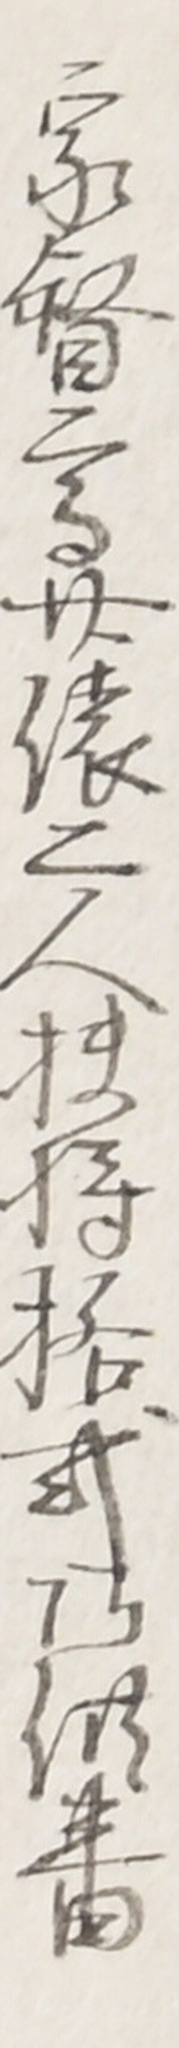家督高廿俵二人扶持格式御供番
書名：無足諸士勤仕録（四）
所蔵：伊那市立高遠町図書館・合同会社AMANE
